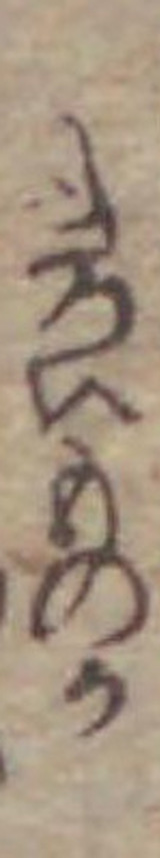しろいものか
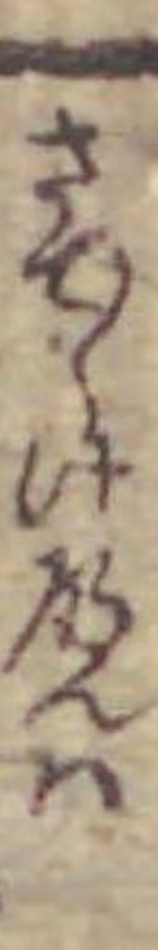さて〳〵此へんは
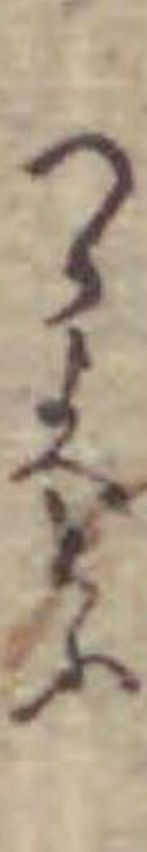つらまへとふ
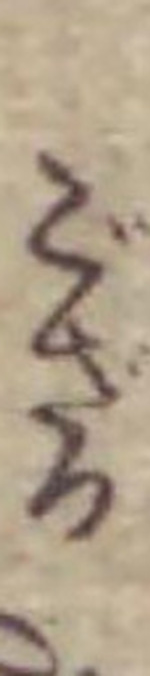ござる

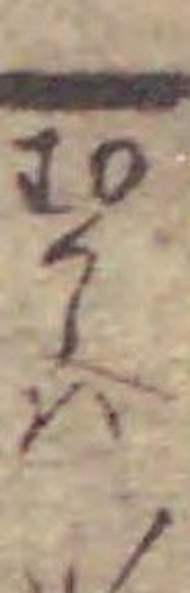むかしは
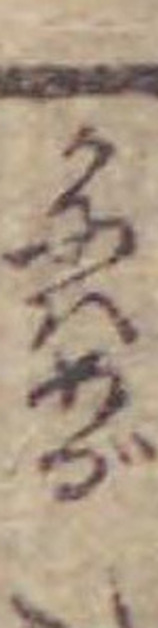かにはめが
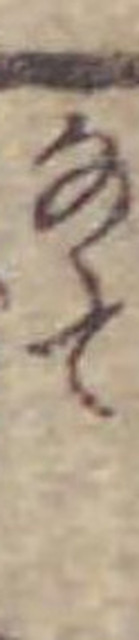なくて
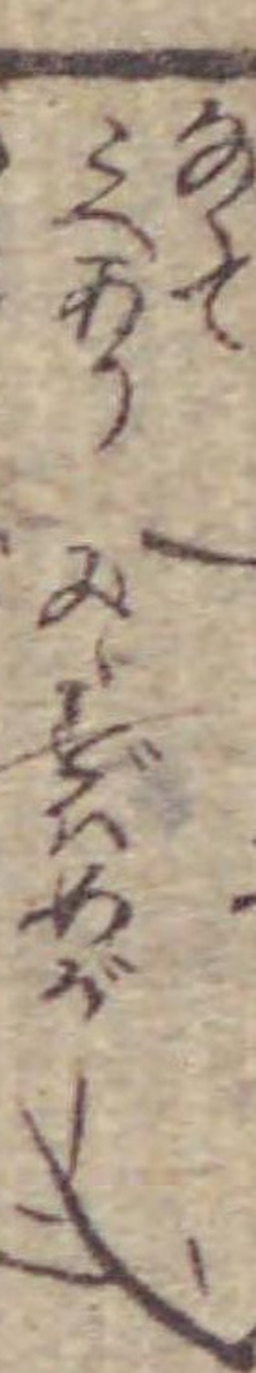こへありみゝずはめが
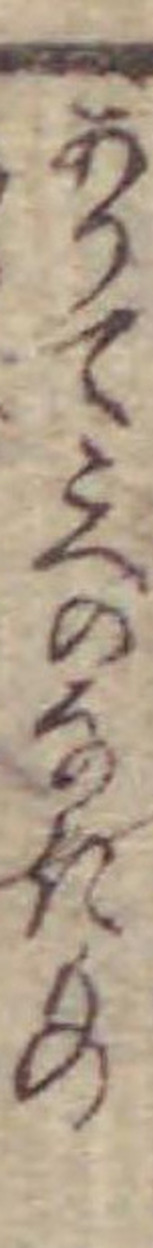ありてこへのなきもの
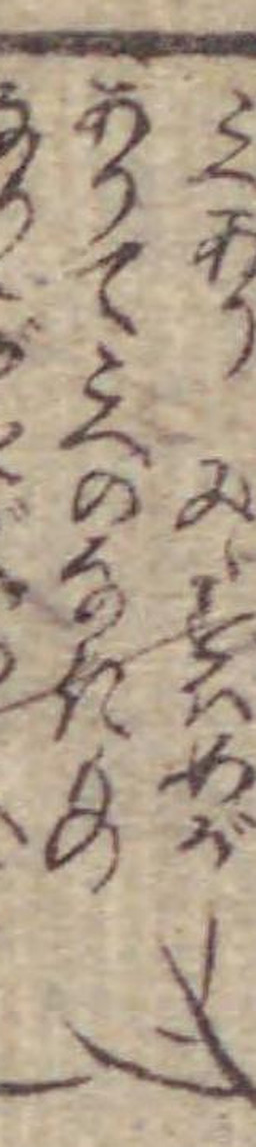ありてこへのなきもの
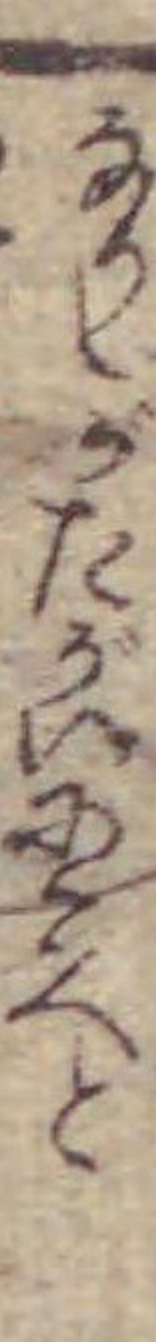なりしがたがいにこへと
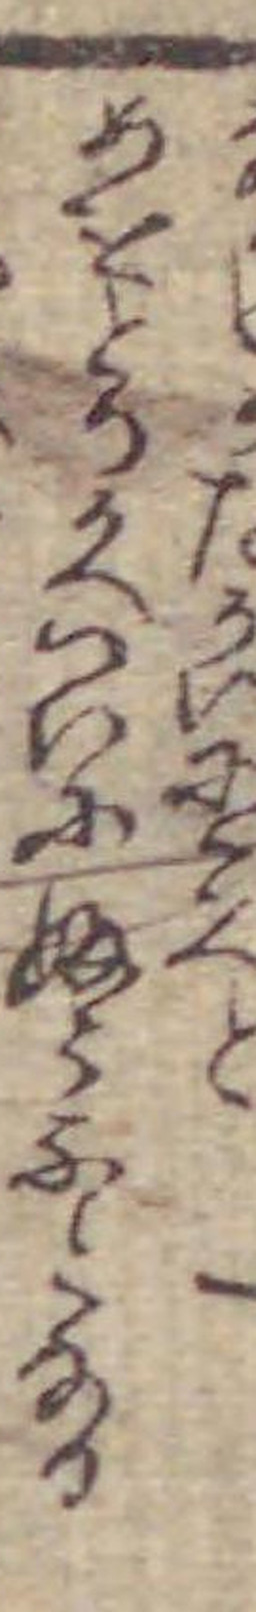めをとりかへついにふうふとなる
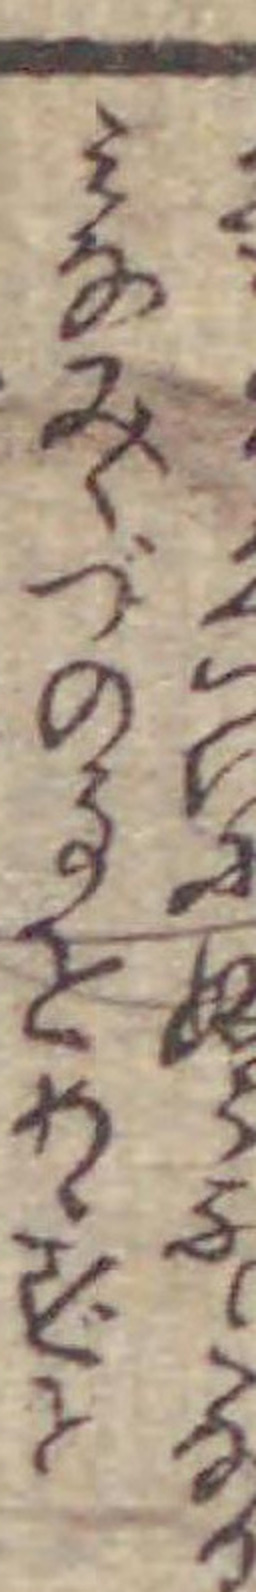みなみゝづの事をめゝずと
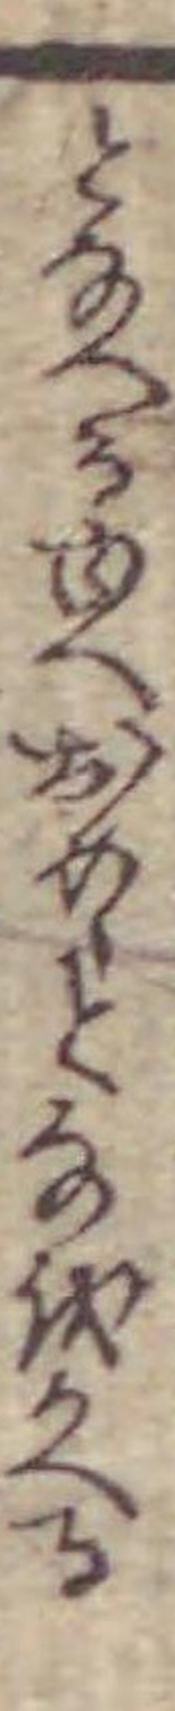となへるゆへおめゝとなをかへる
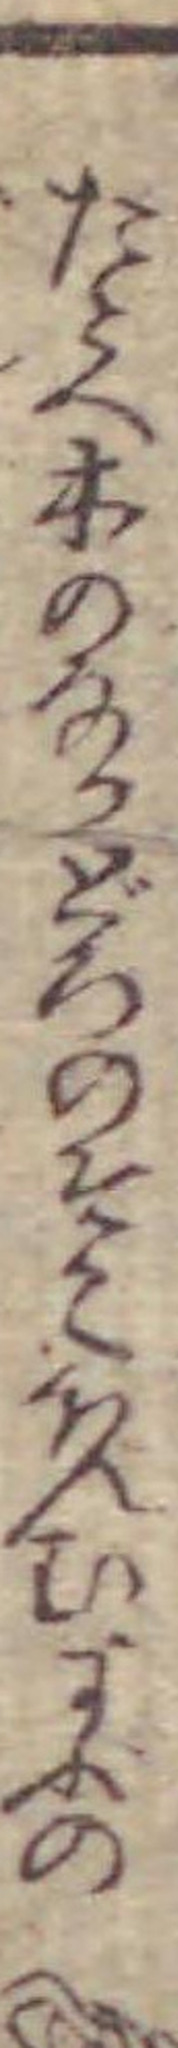たとへ木のなかどろのそこほんむずぶの
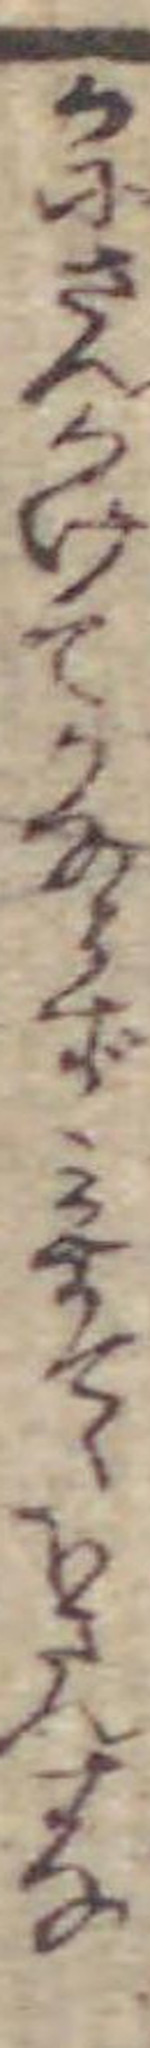かにさんかけてかならずみすてゝ下さんすな
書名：交古勢昔咄 : 2巻
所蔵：国立国会図書館 National Diet Library, JAPAN
